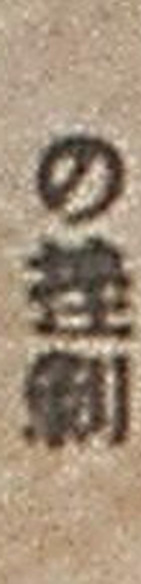の挫剥
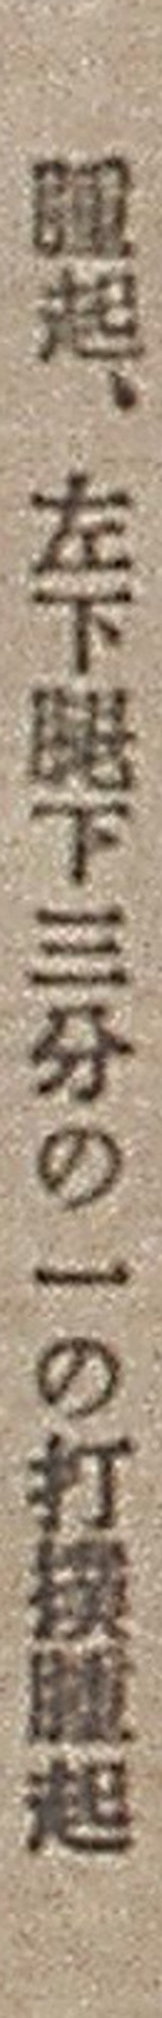腫起、左下腿下三分の一の打撲腫起
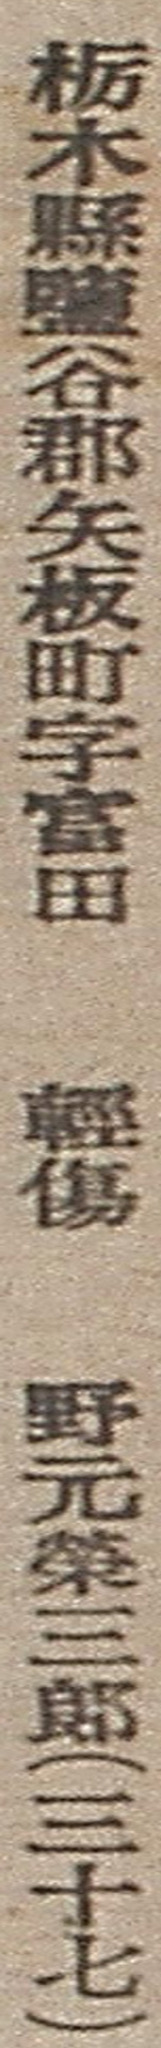栃木県塩谷郡矢板町字富田軽傷野元栄三郎
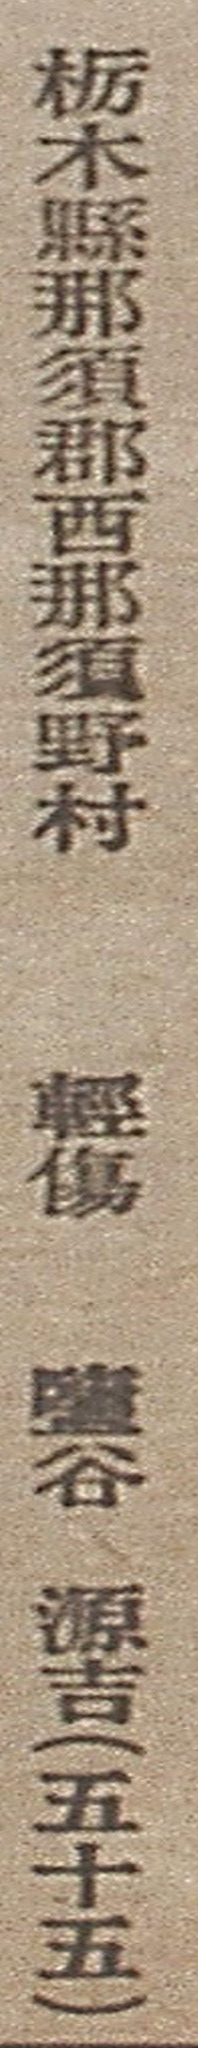栃木県那須郡西那須野村軽傷塩谷源吉
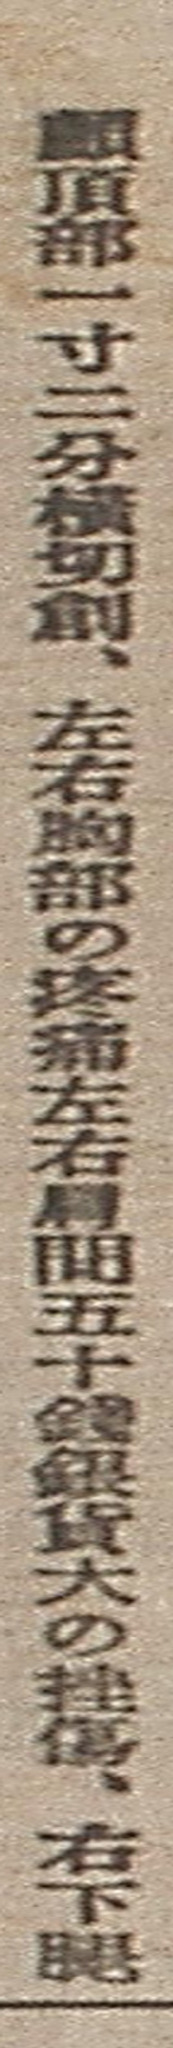頗頂部一寸二分横切創、左右胸部の疼痛左右眉間五十銭銀貨大の挫傷、右下腿
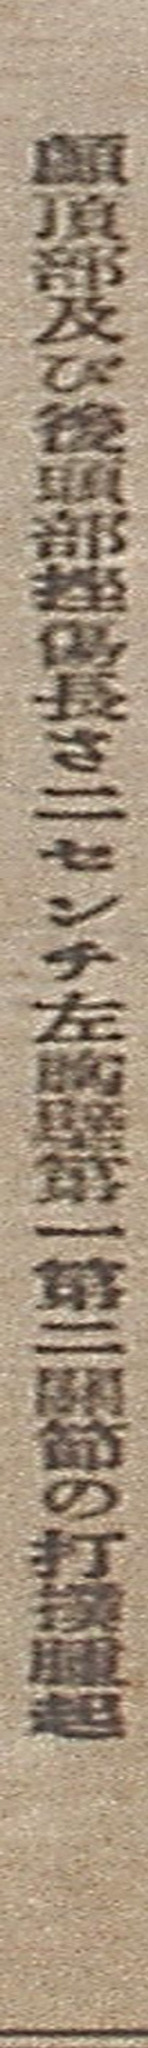頗頂部及び後頭部挫傷長さ二センチ左胸壁部第一第二関節の打撲腫起
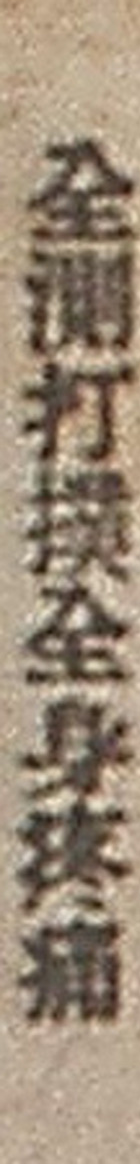全側打撲全身疼痛
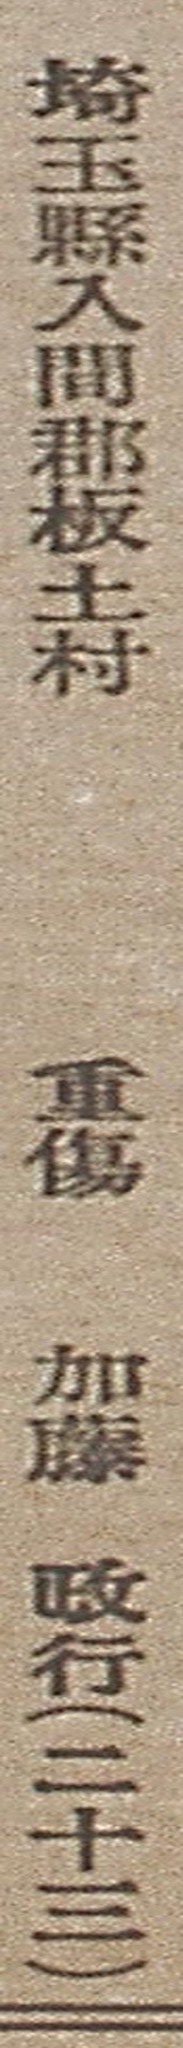埼玉県入間郡板土村重傷加藤政行
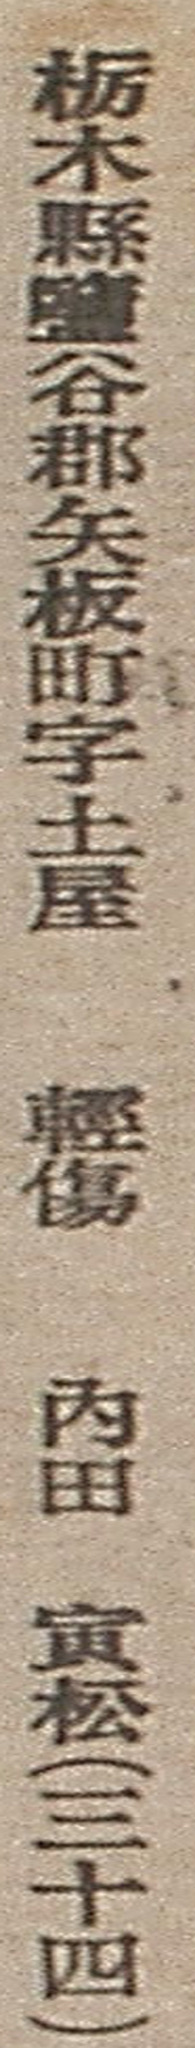栃木県塩谷郡屋板町字土屋軽傷内田寅松
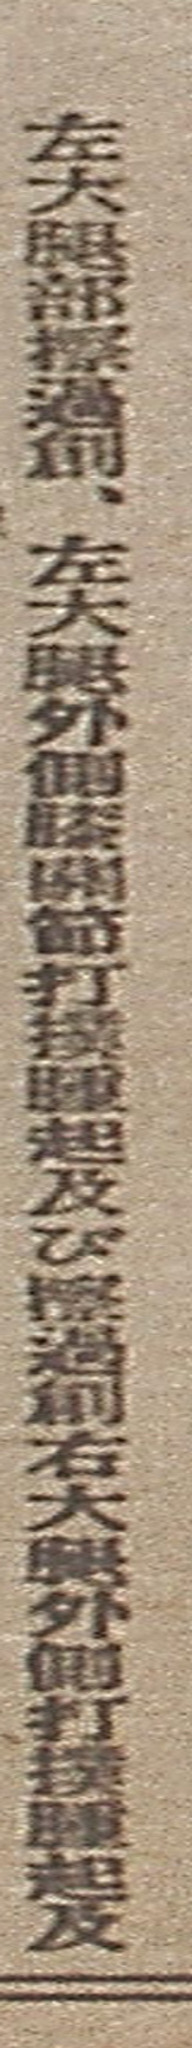左大腿部擦過創、左大腿外側膝関節打撲腫起及び擦過創右大腿外側打撲腫起及
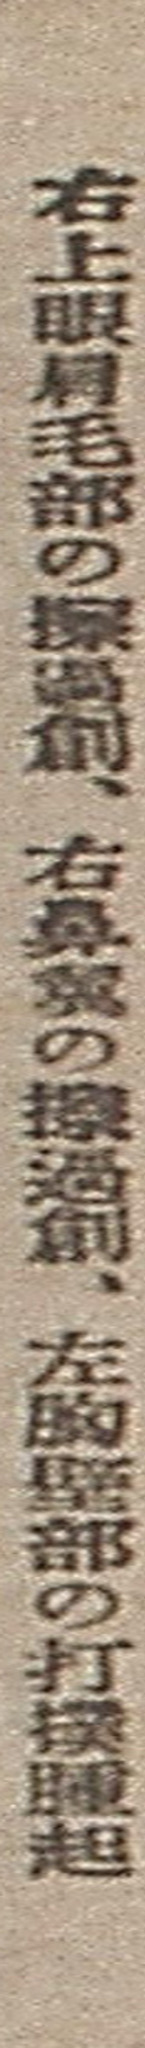右上眼眉毛部の擦過創、右鼻翼の擦過創、左胸壁部の打撲腫起
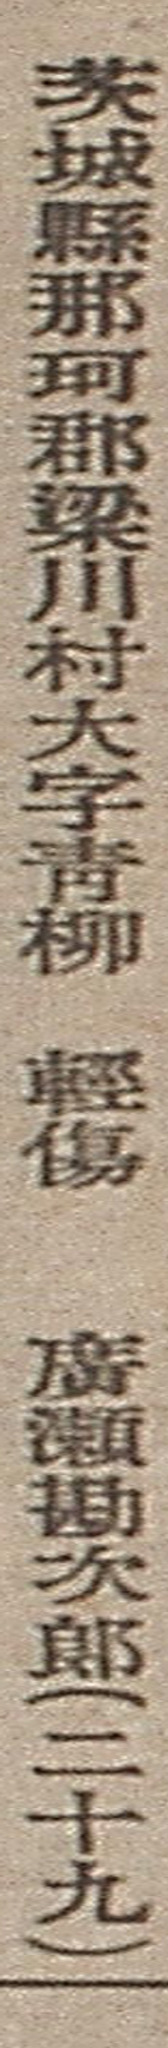茨城県那珂郡梁川村大字青柳軽傷広瀬勘次郎
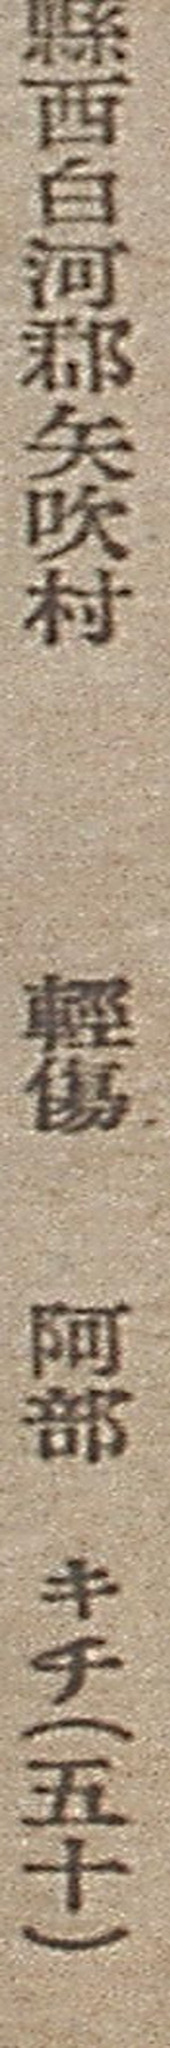福島県西白河郡矢吹村軽傷阿部キチ
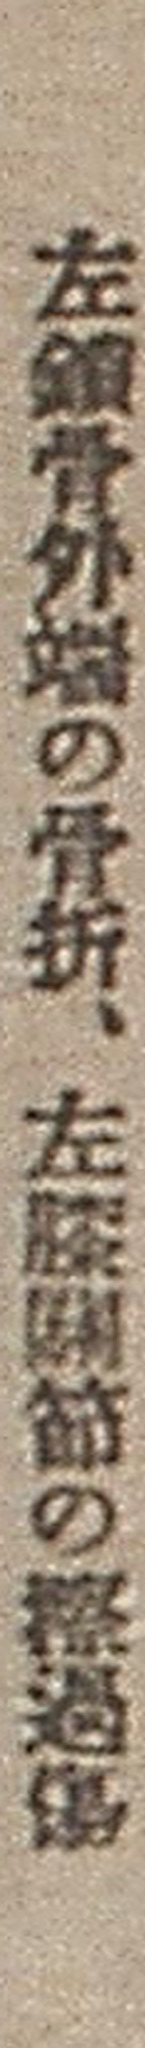左鎖骨外端の骨折、左膝関節の擦過傷
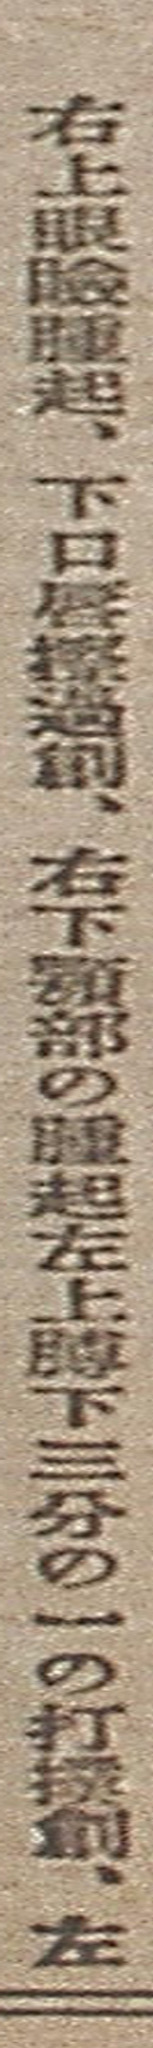右上眼瞼腫起、下口唇擦過創、右下顎部の腫起左上膞下三分の一の打撲創、左
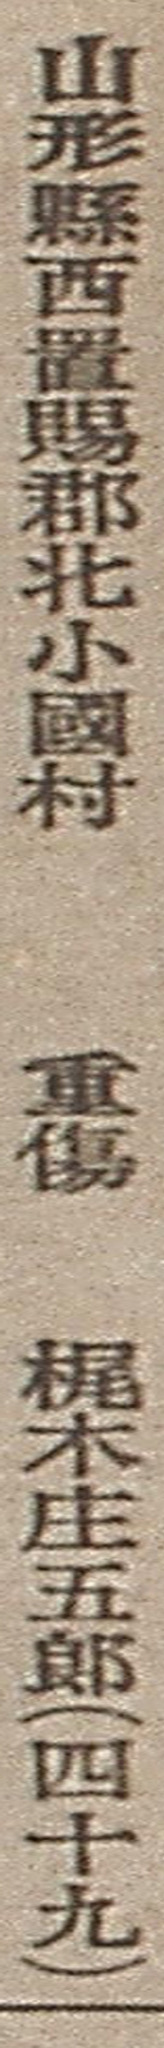山形県西置賜郡北小国村重傷梶木庄五郎
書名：風俗畫報臨時増刊第百九十九號　明治三十二年十月各地災害圖會（前編之續）
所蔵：東京大学地震研究所図書室 Earthquake Research Institute Library, The University of Tokyo, JAPAN
